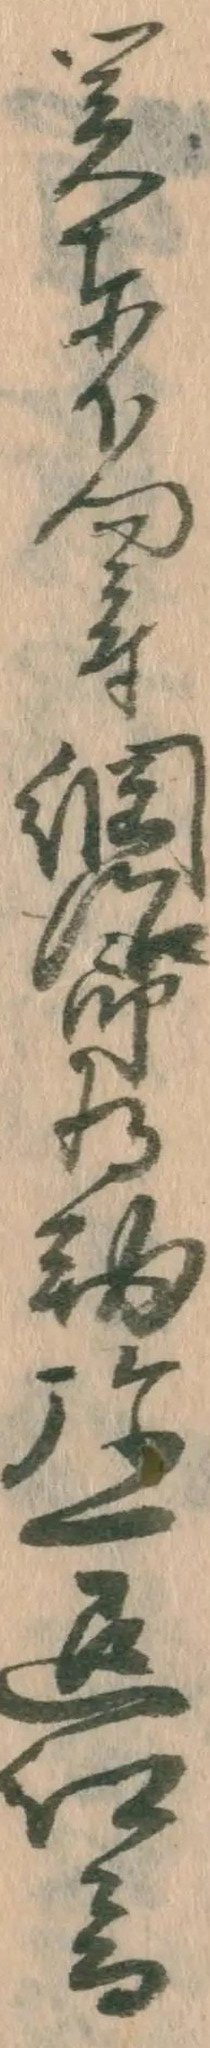関東下向ニ付綱治郎為勤弥一退郷ニ而
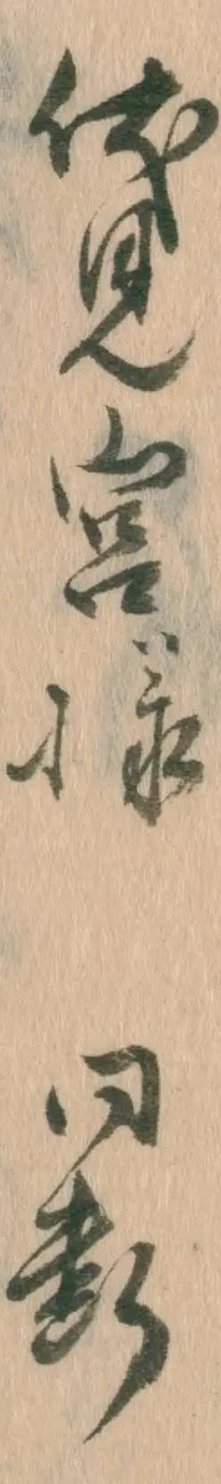伏見宮様同断
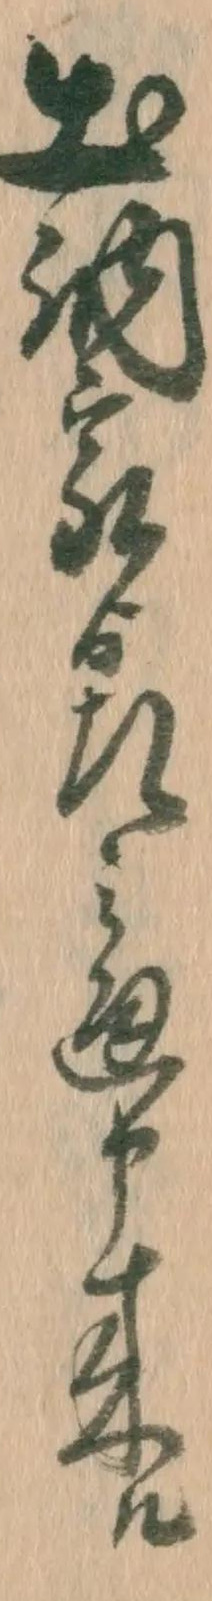出納家ゟ左之通申来ル
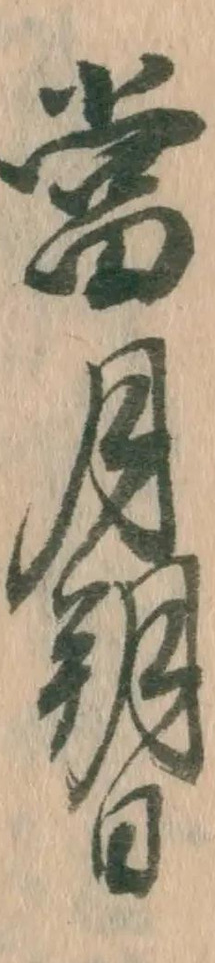当月朔日
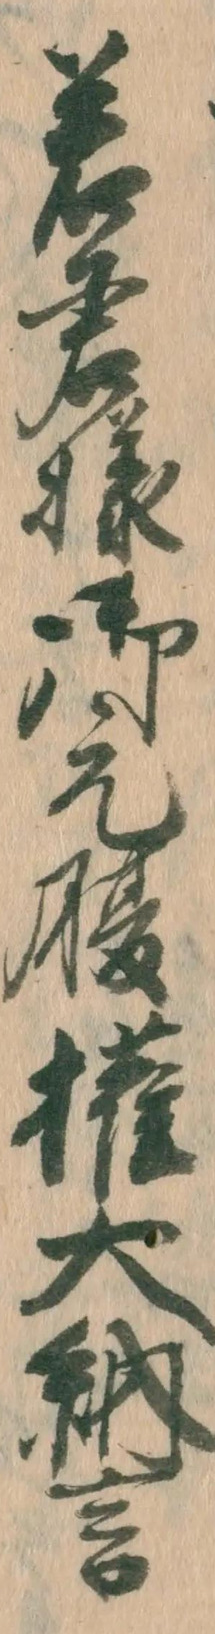若君様御元腹権大納言
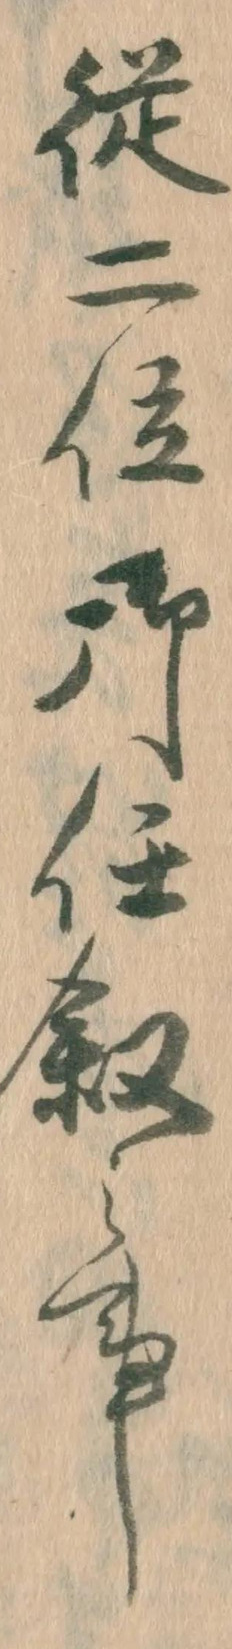従二位御任叙之事
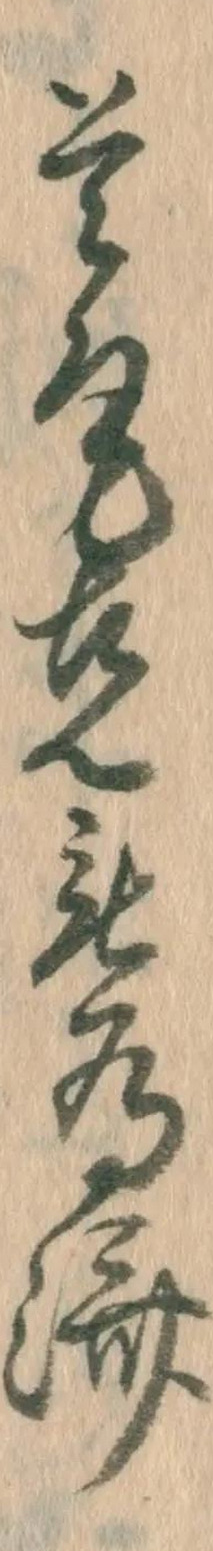首尾克被為済
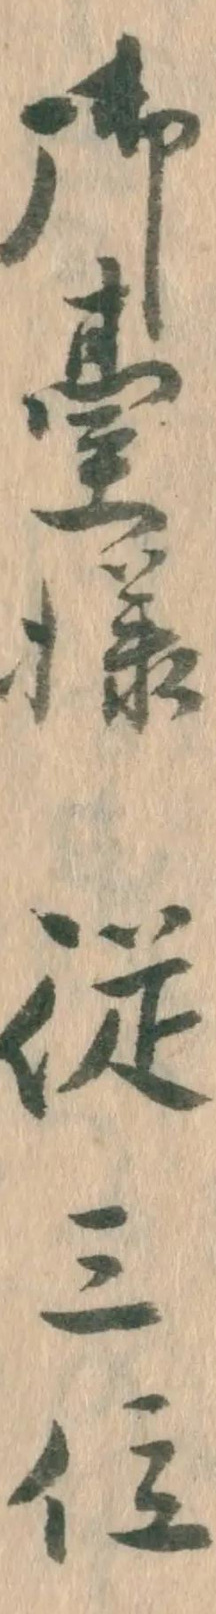御台様従三位
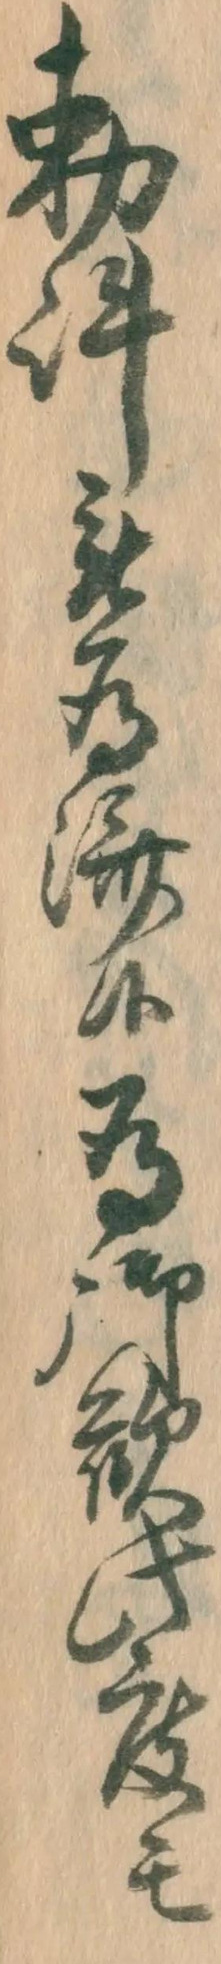勅許被為済候為御歓此度モ

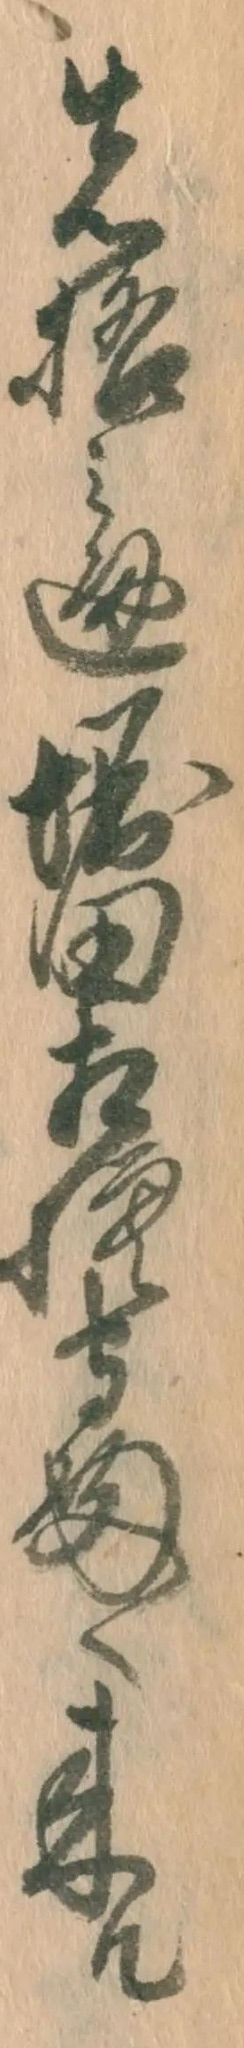先格之通堀田相模守殿へ来ル
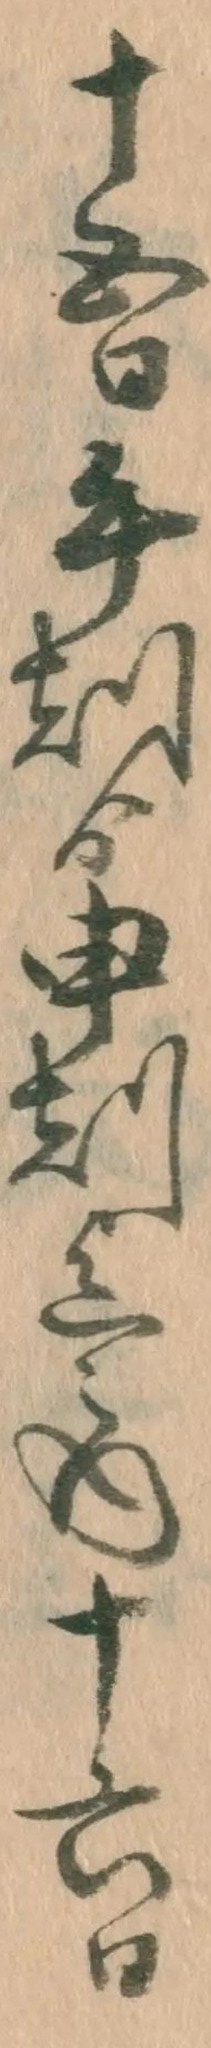十五日午刻ゟ申刻迄之内十六日
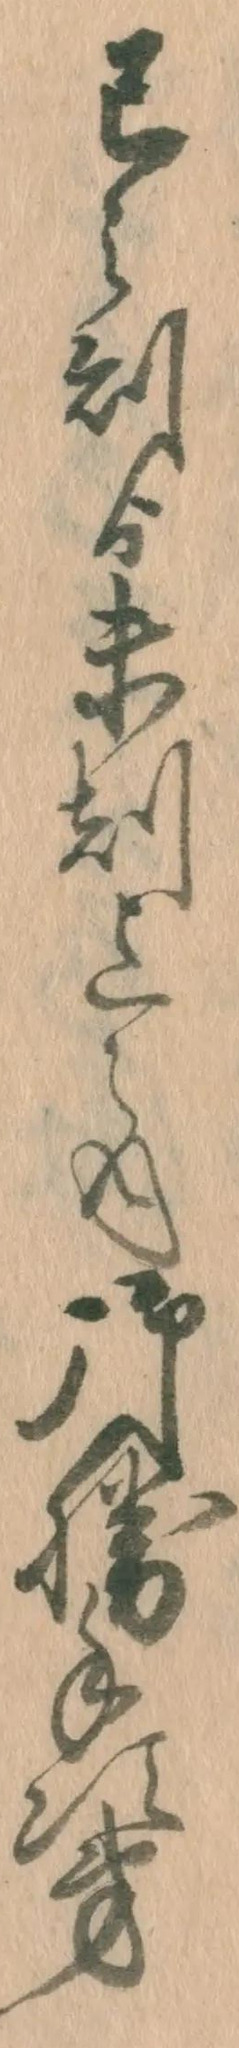巳之刻ゟ未刻迄之内御勝手次第
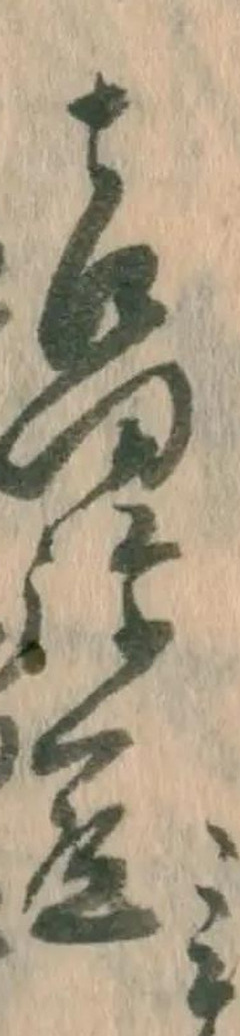吉田弥一殿
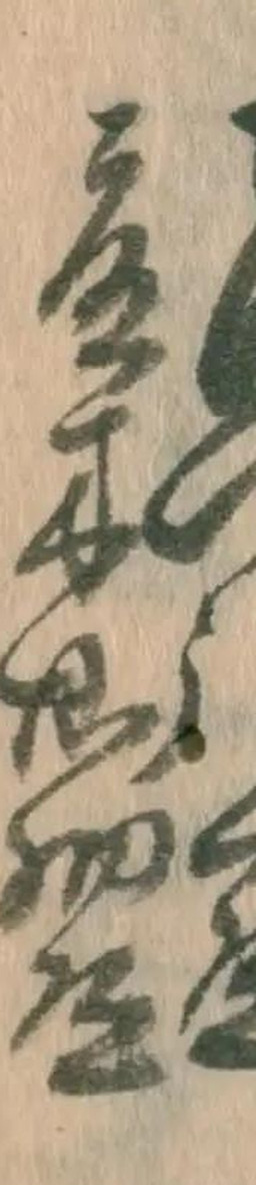藤木仙納殿
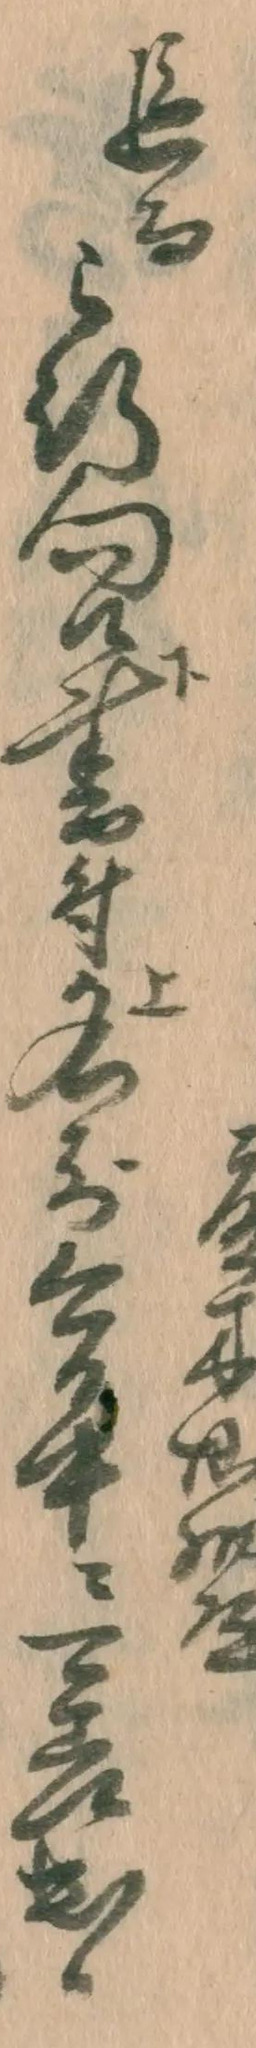被行向候書付名前今日中ニ可差出候
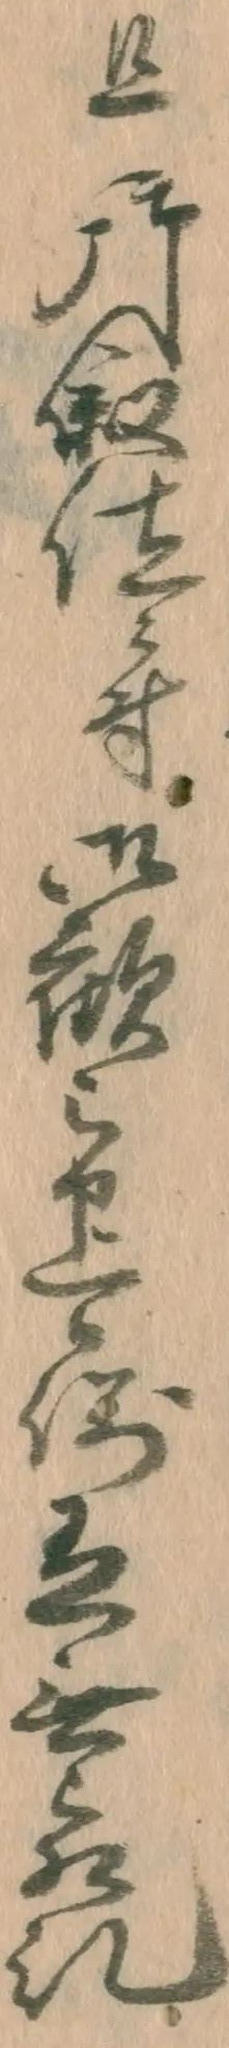且御叙仕ニ付御歓被申上候例有無被相糺
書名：賀茂社記録. 第61冊
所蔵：国立国会図書館 National Diet Library, JAPAN
